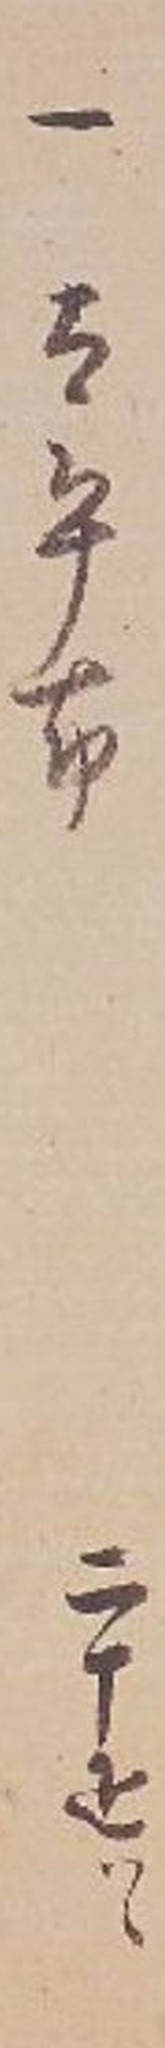一太平布二十疋ツヽ
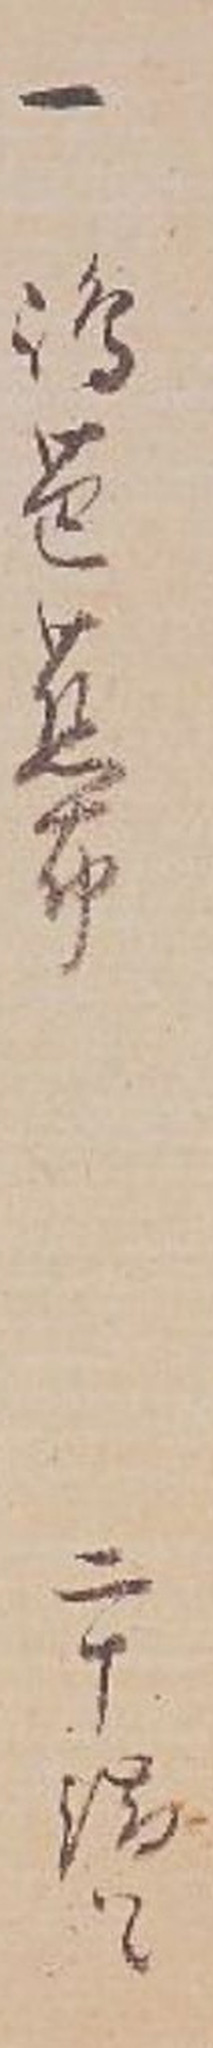一島芭蕉布二十端ツヽ
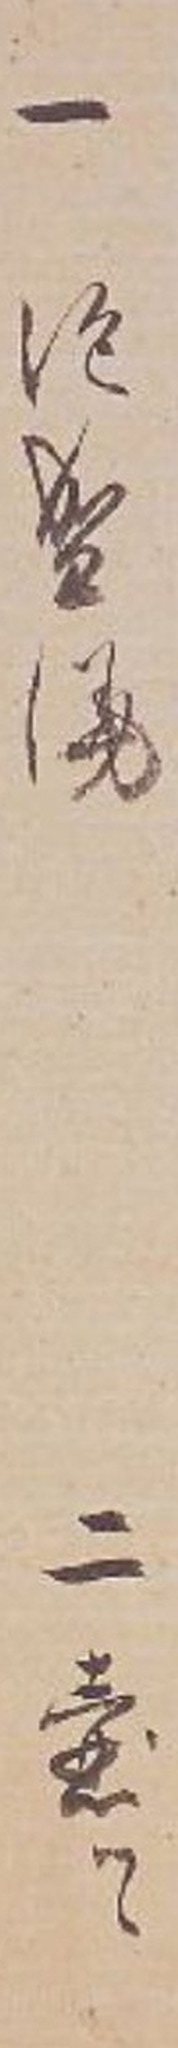一泡盛酒二壺ツヽ
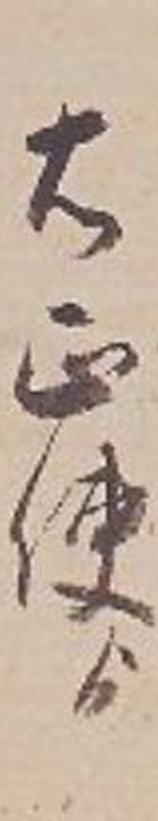右正使ゟ

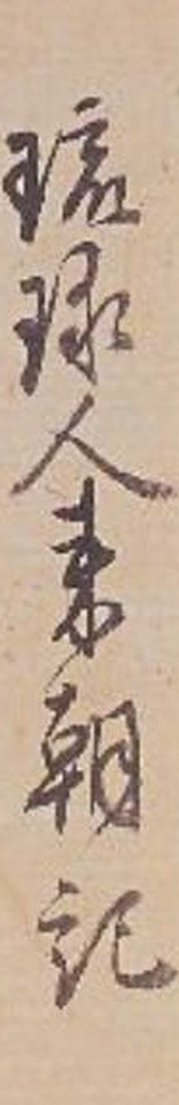琉球人来朝記
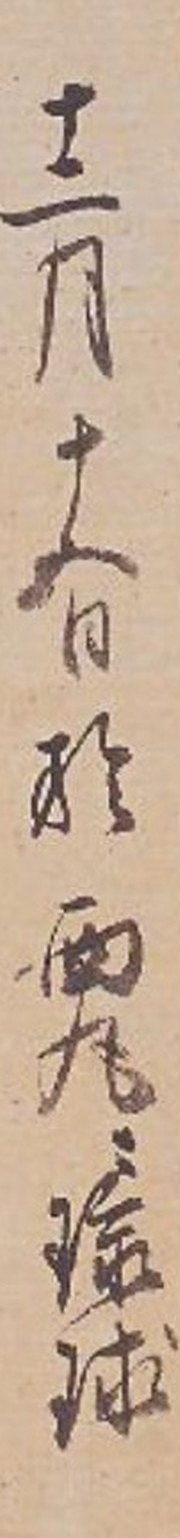十二月十五日於西丸に琉球
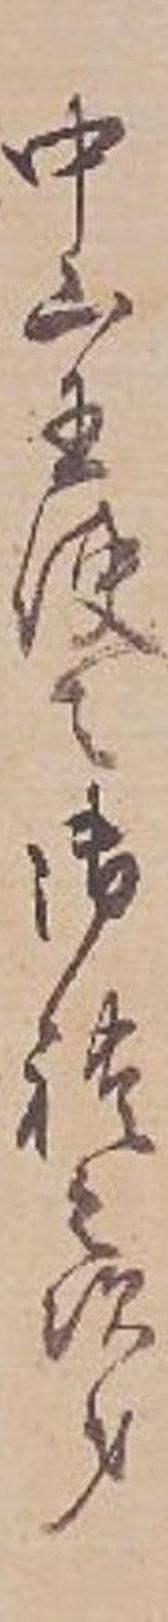中山王使者御礼之次第
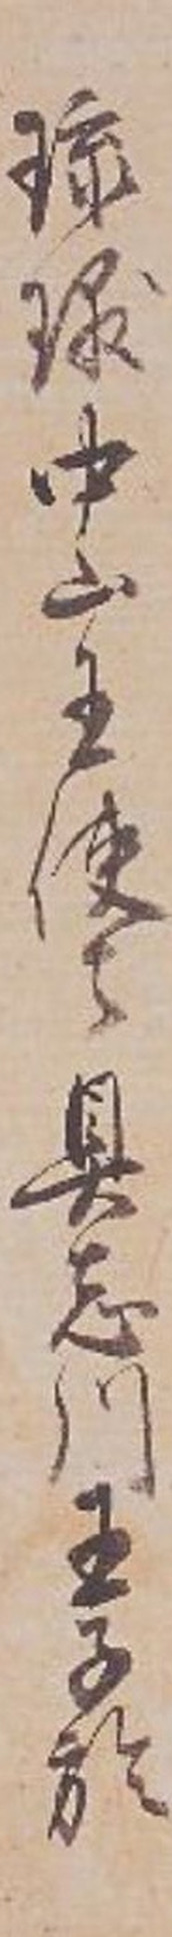琉球中山王使者具志川王子於
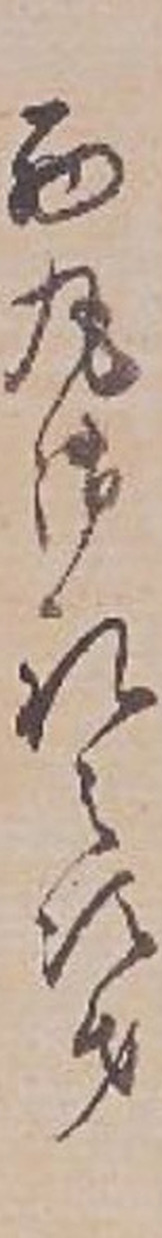西丸御礼之次第
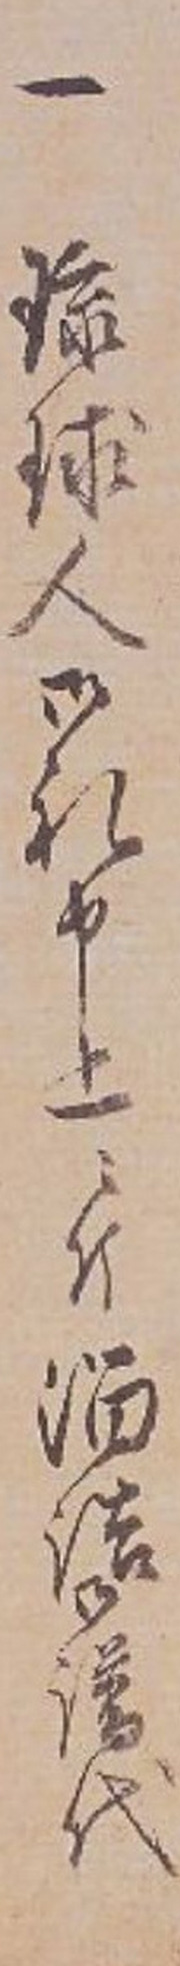一琉球人御礼申上に付溜詰御譜代

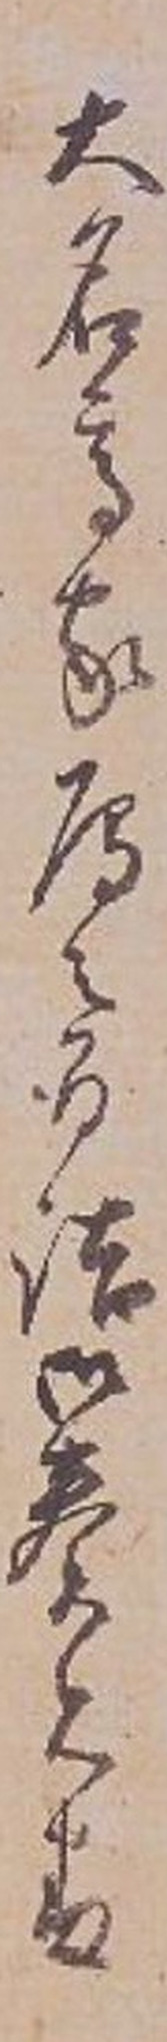大名高家雁之間詰御奏者番
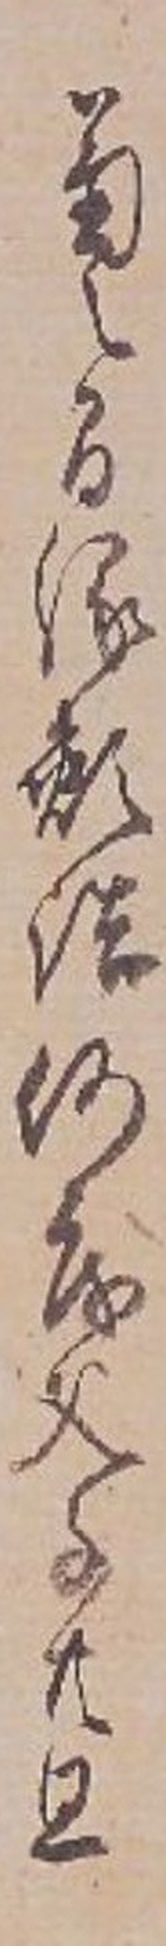菊之間縁頬詰何も父子共且
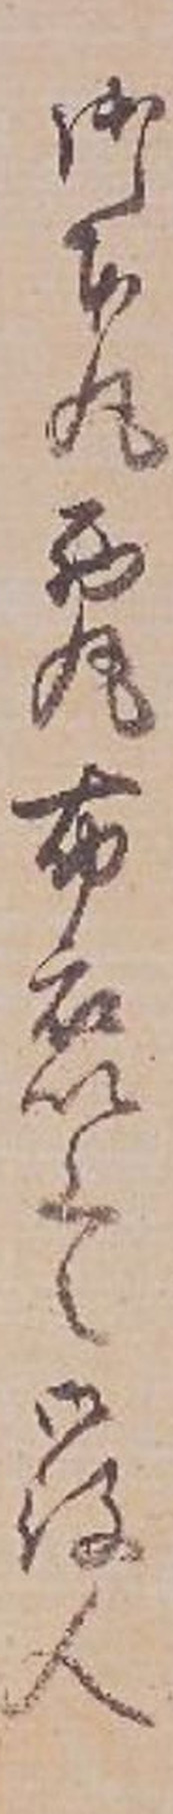御本丸西丸布衣以上之御役人
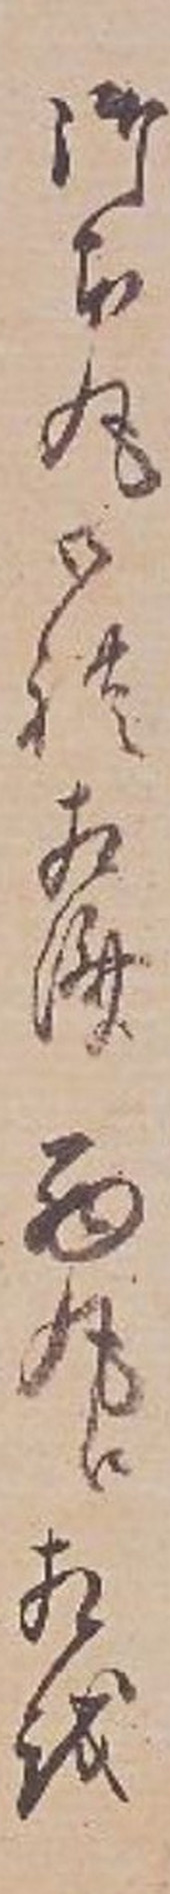御本丸御礼相済西丸え相越
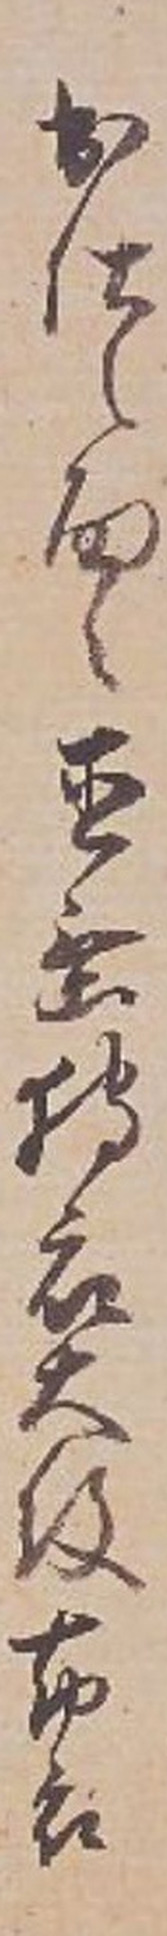出仕之面々直垂狩衣大紋布衣
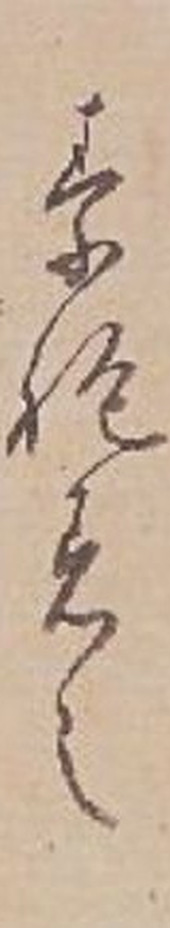素袍着之
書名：琉球人来朝記 五、六、七
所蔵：University of the Ryukyus Library
